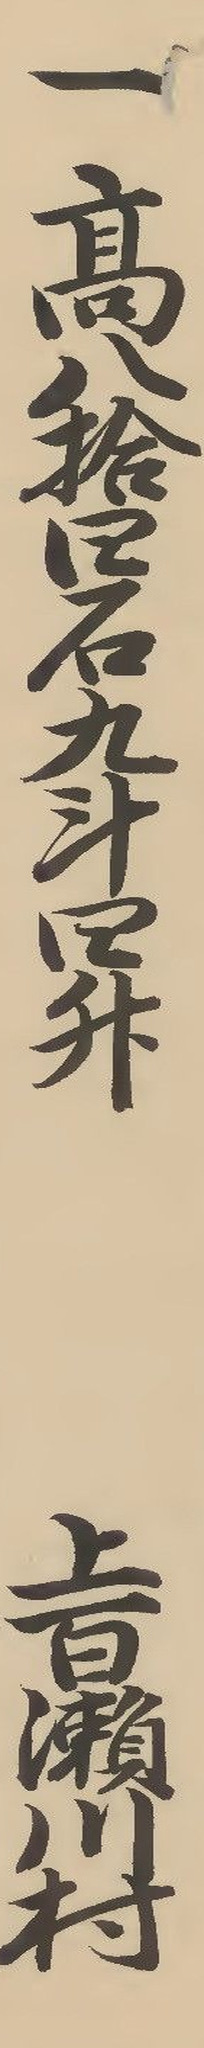一高八拾四石九斗四升上百瀬川村
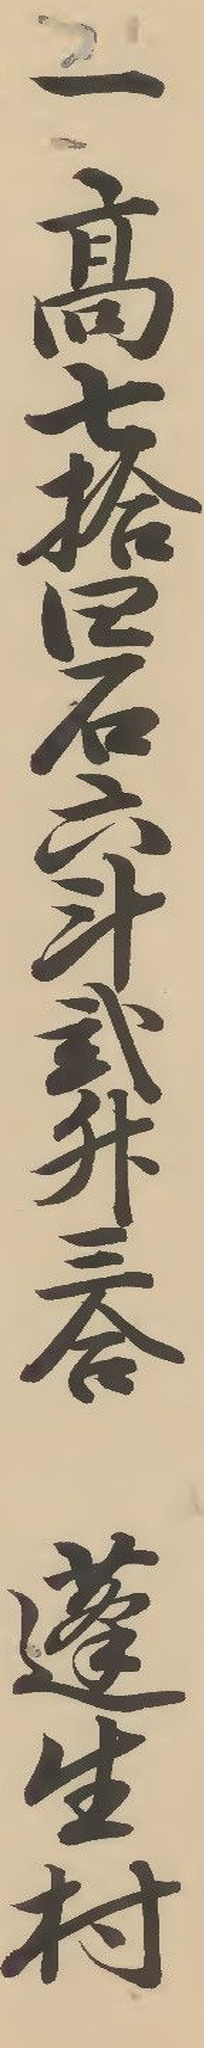一高七拾四石六斗弐升三合蓬生村
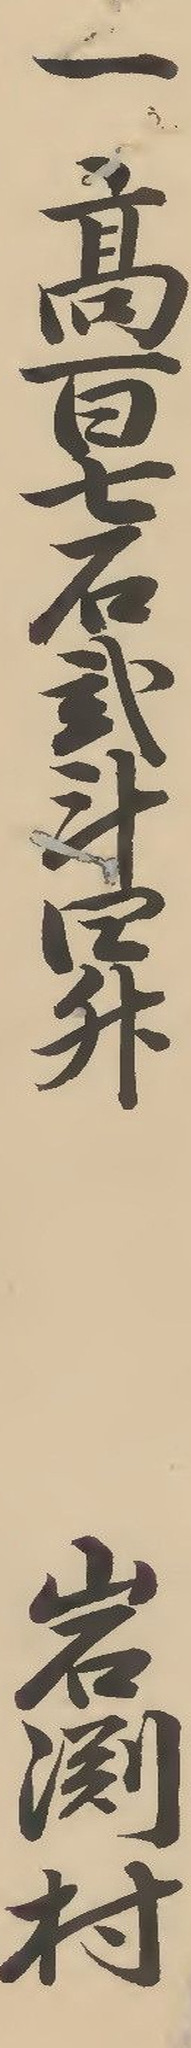一高百七石弐斗四升岩渕村
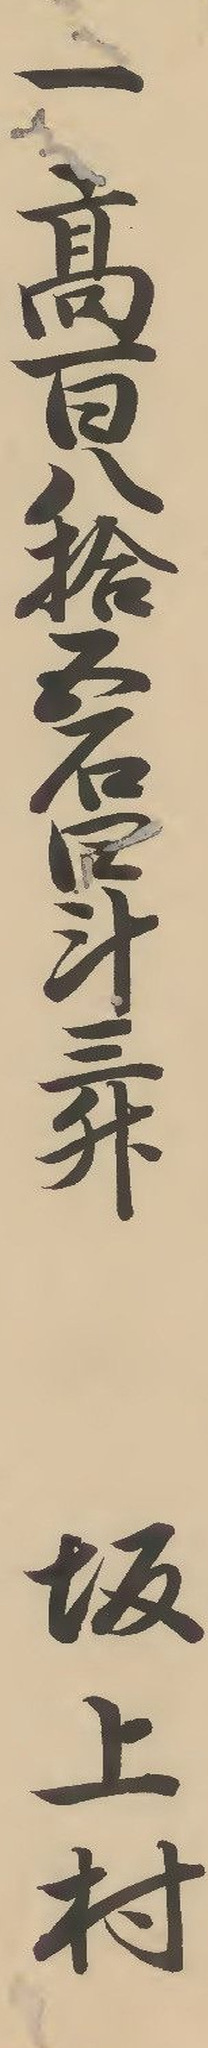一高百八拾五石四斗三升坂上村
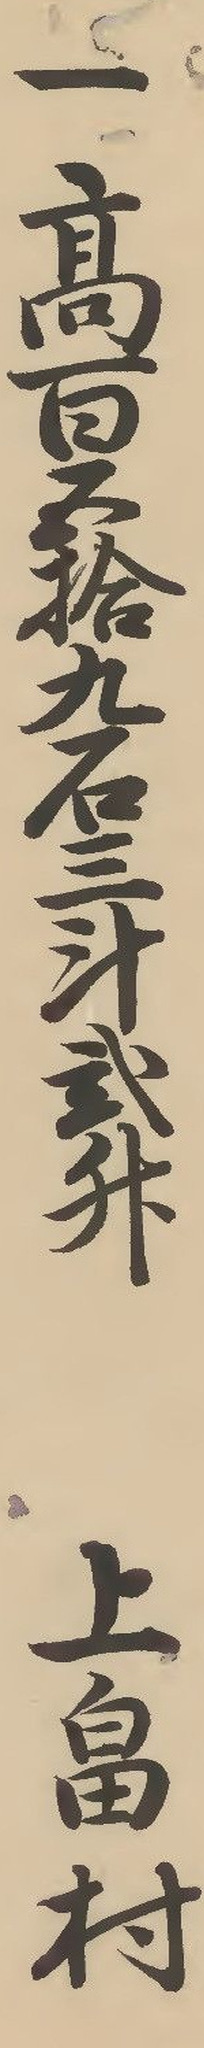一高百五拾九石三斗弐升上畠村
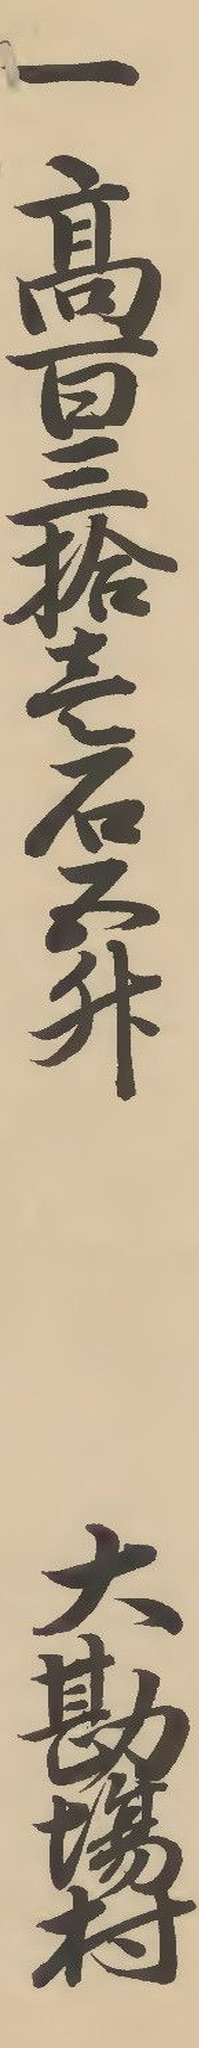一高百三拾壱石五升大勘場村
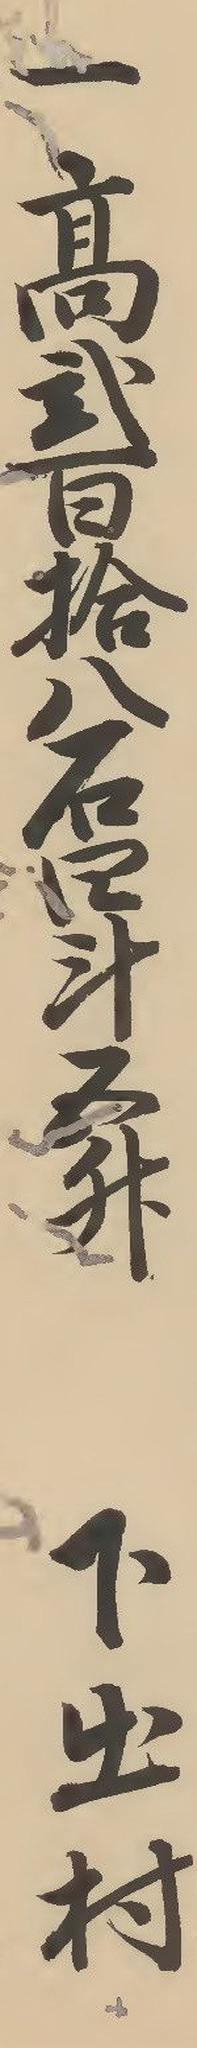一高弐百拾八石四斗五升下出村

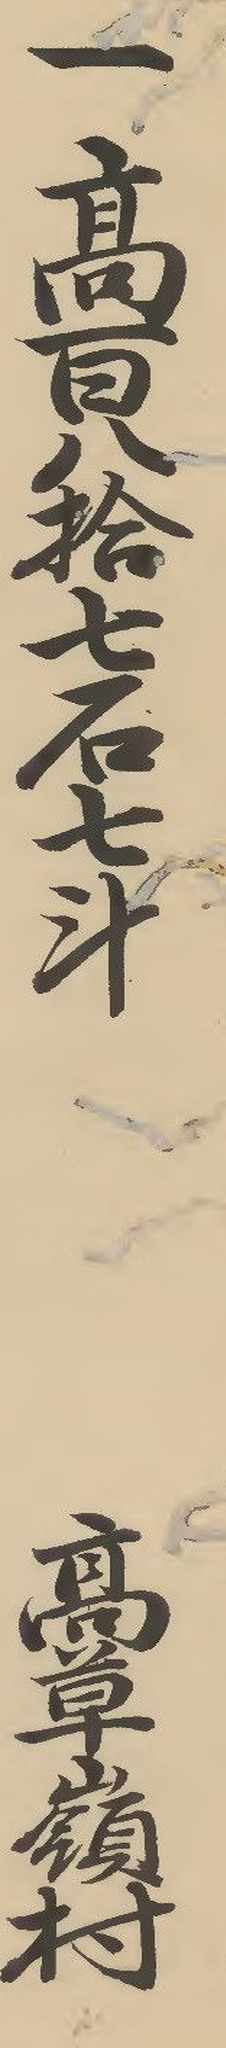一高百八拾七石七斗高草嶺村
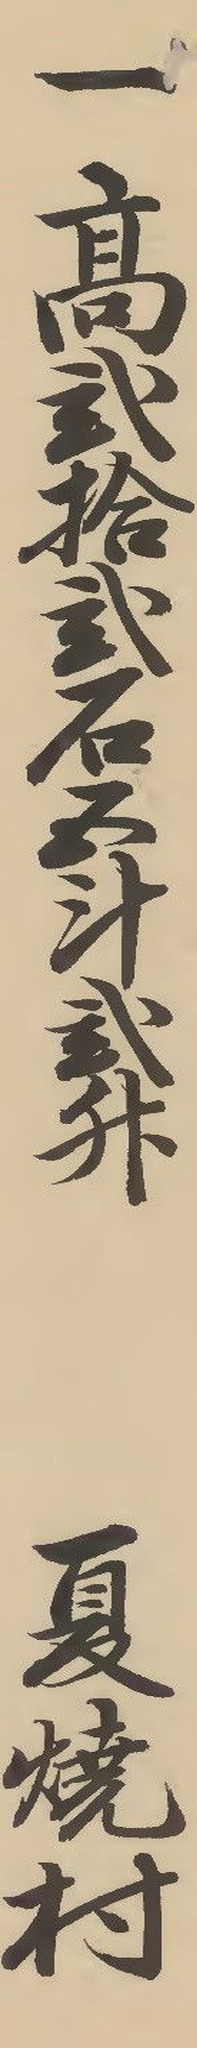一高弐拾弐石五斗弐升夏焼村
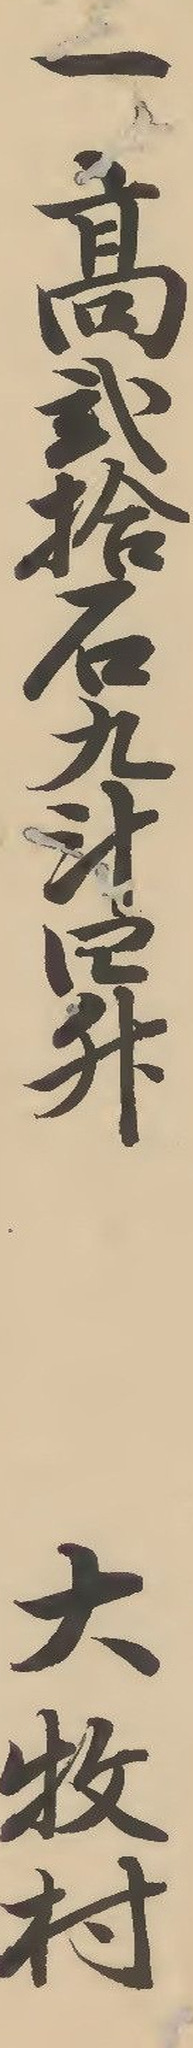一高弐拾石九斗四升大牧村
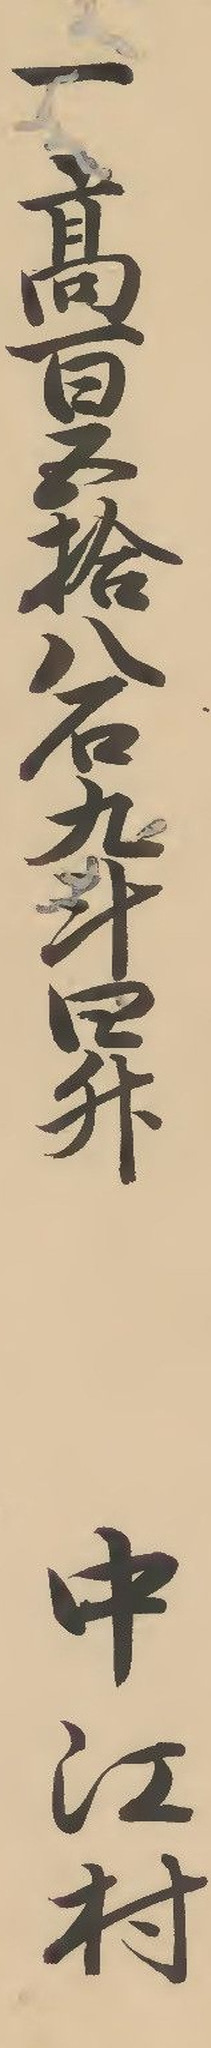一高百五拾八石九斗四升中江村
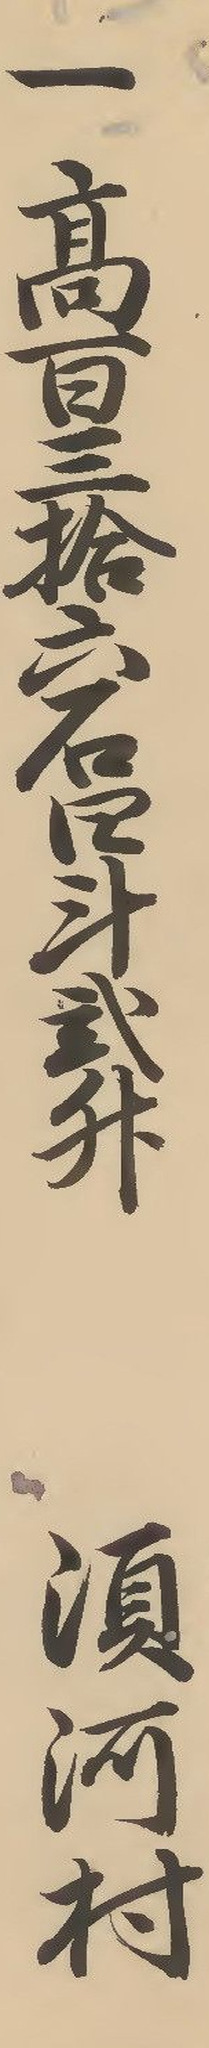一高百三拾六石四斗弐升須河村
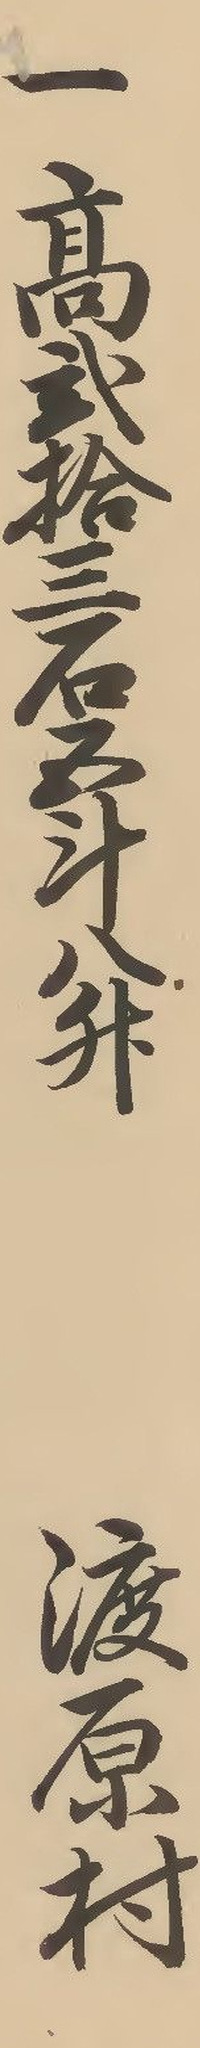一高弐拾三石五斗八升渡原村
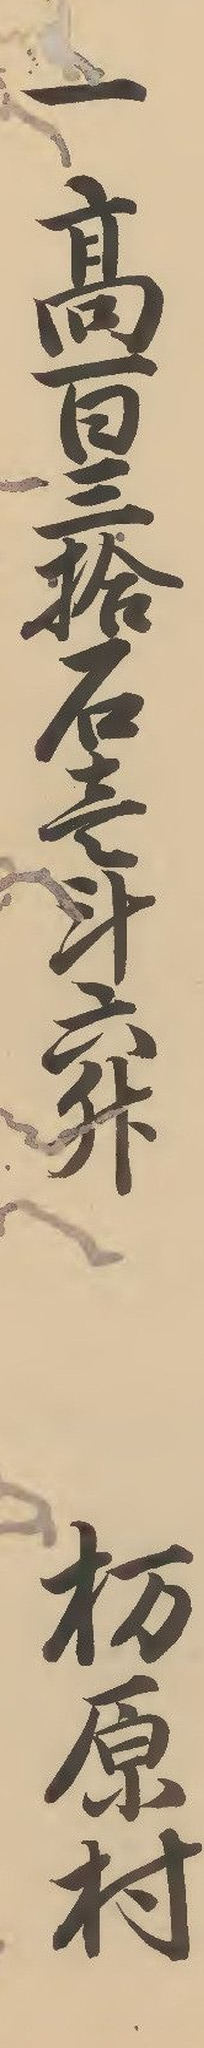一高百三拾石壱斗六升栃原村

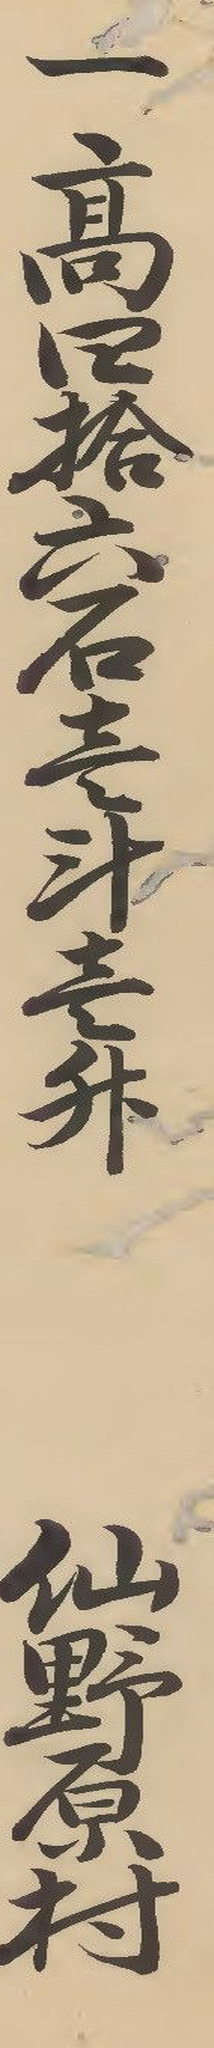一高四拾六石壱斗壱升仙野原村
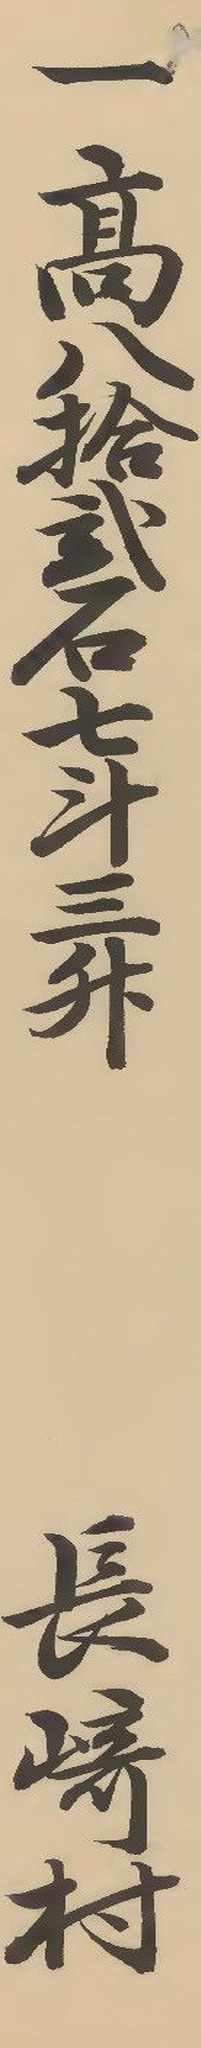一高八拾弐石七斗三升長崎村
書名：越中国郷帳
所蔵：国立公文書館 National Archives of Japan
